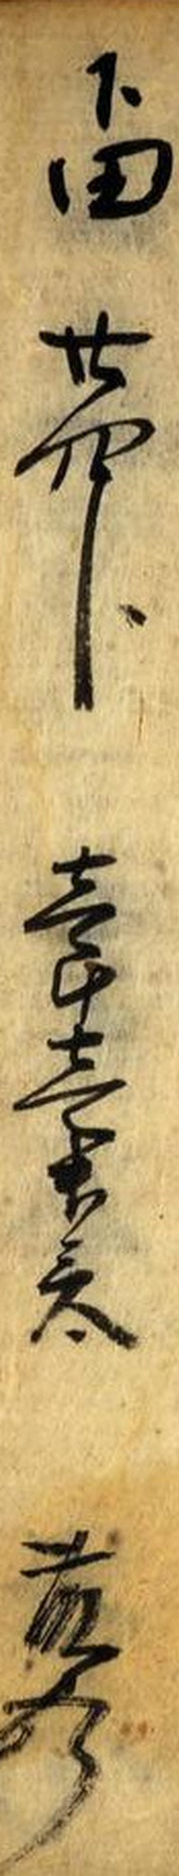下田廿四分壱斗壱升三合藤五郎
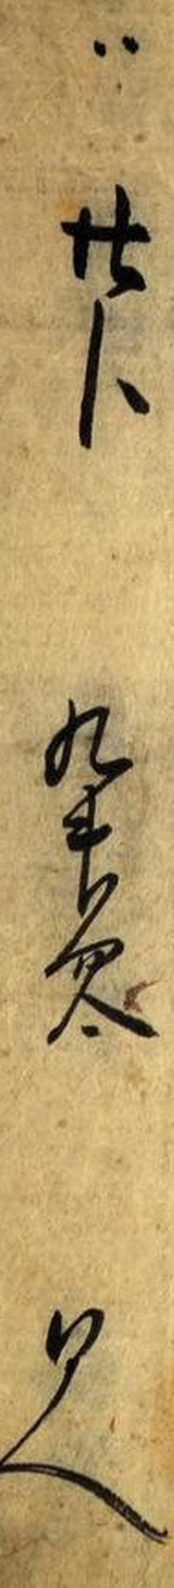同廿分九升四合同人

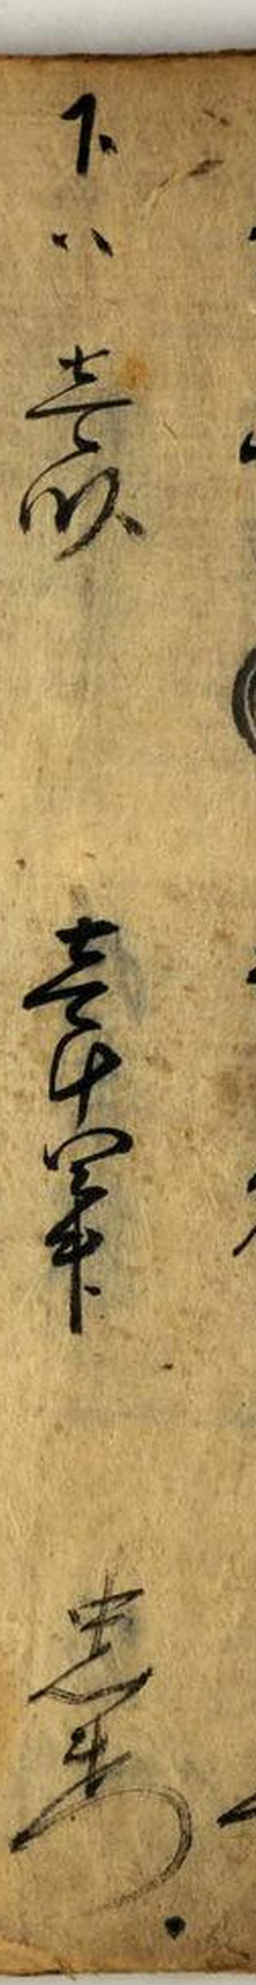下同壱畝壱斗四升忠右衛門
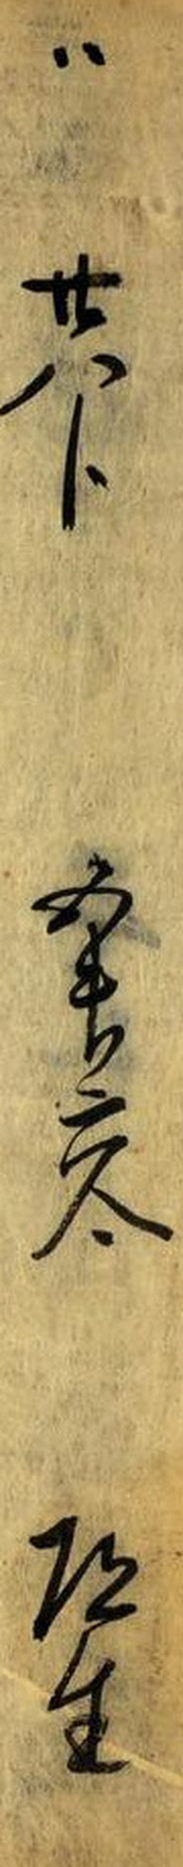同廿八分五升六合邦生
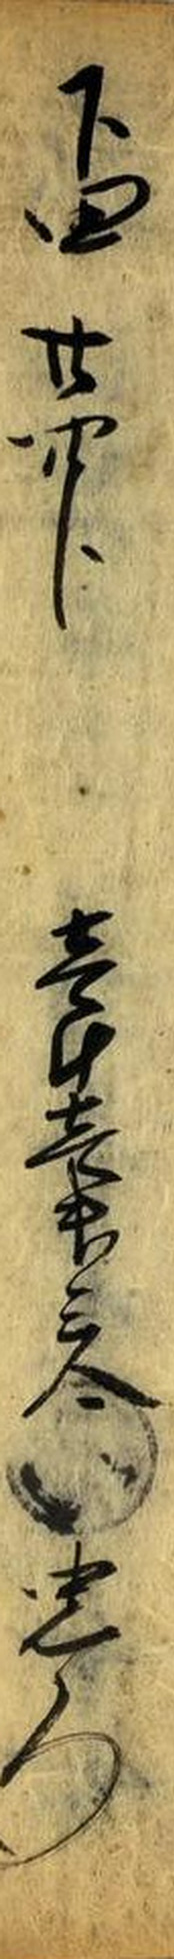下田廿四分壱斗壱升三合㊞忠右衛門
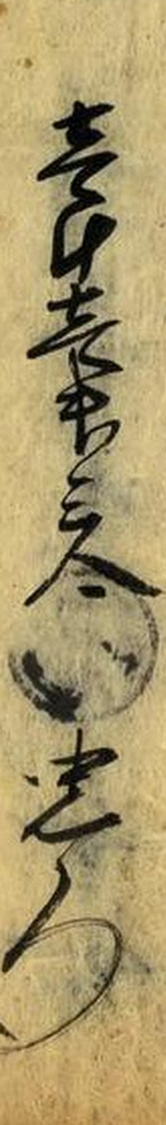同弐セ壱斗六合忠右衛門
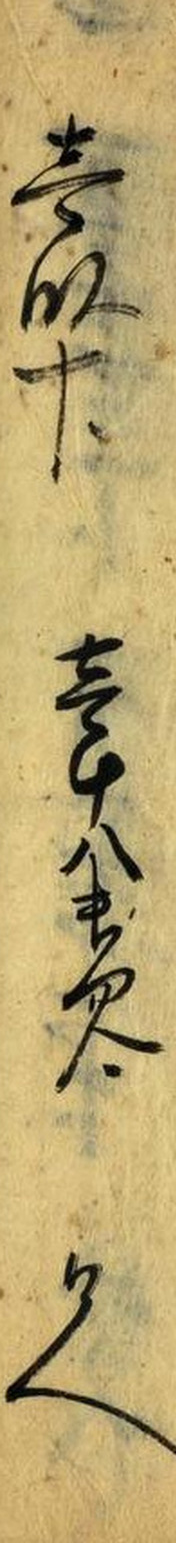同壱畝十分壱斗八升四合同人
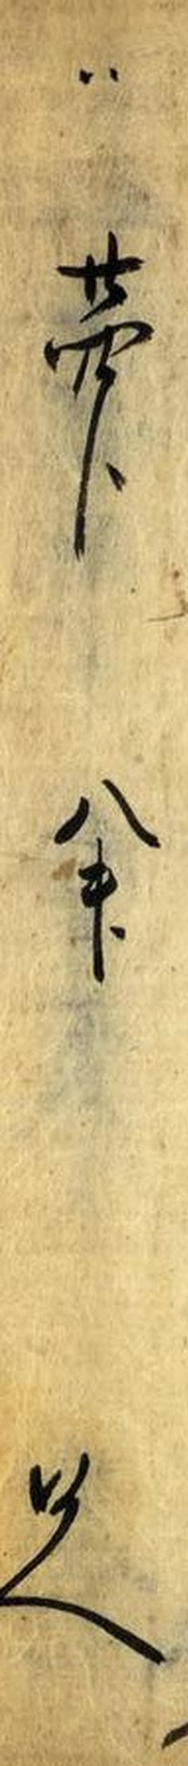同廿四分八升同人
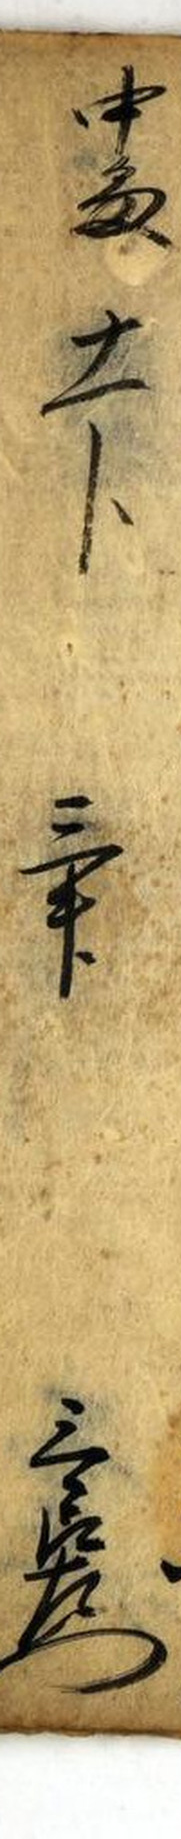中畠十一分三升三郎左衛門
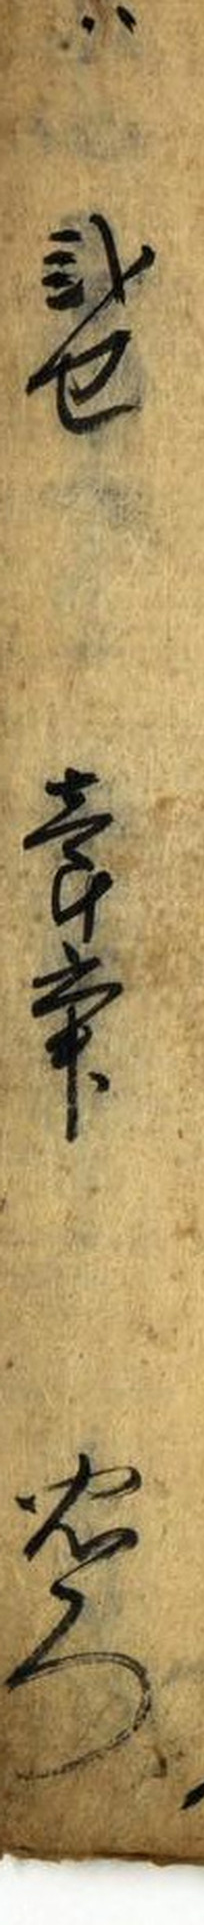同弐セ壱斗六合忠右衛門

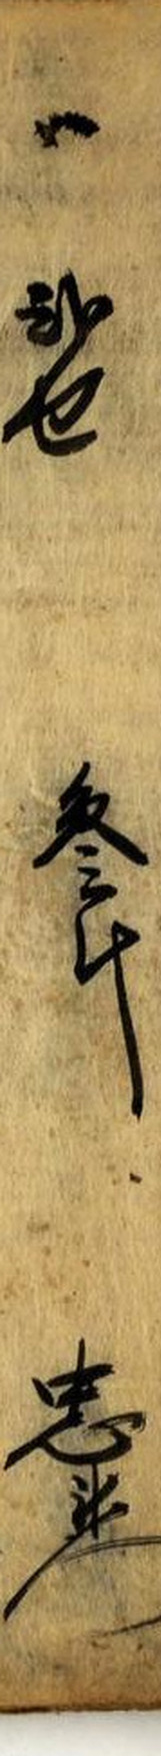同弐セ参斗忠右衛門
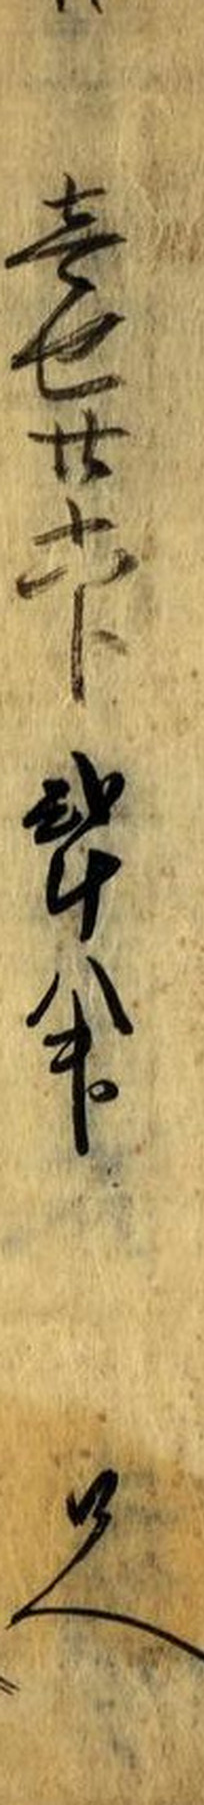同壱セ廿六分弐斗八升同人
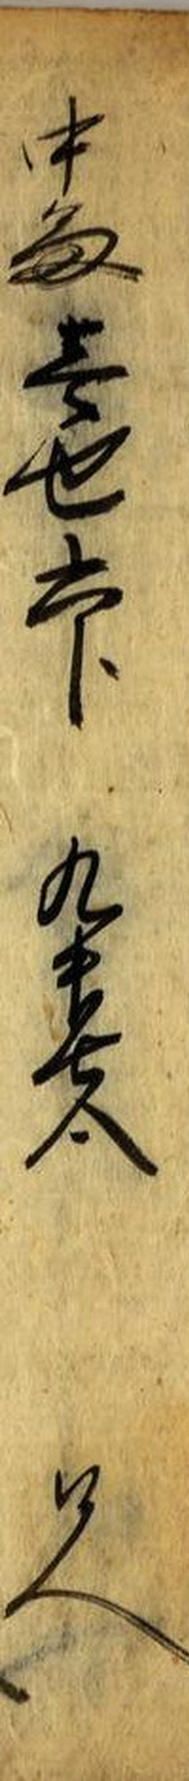中畠壱セ六分九斗七合同人
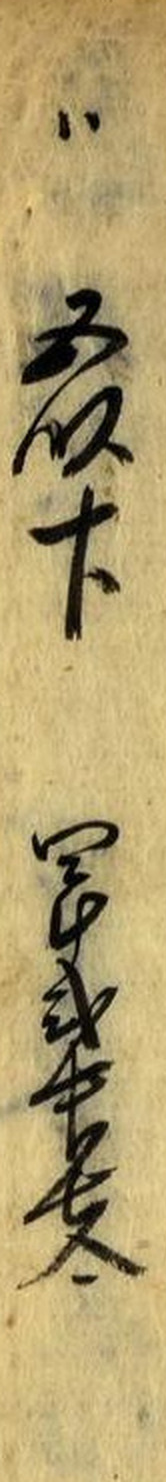同五畝一文四斗弐升七合同人
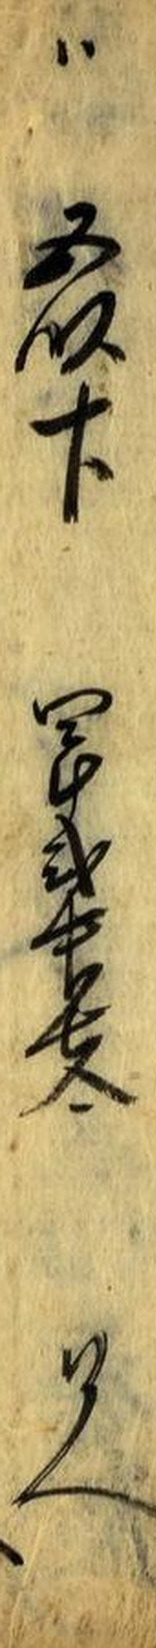同五畝一文四斗弐升七合同人
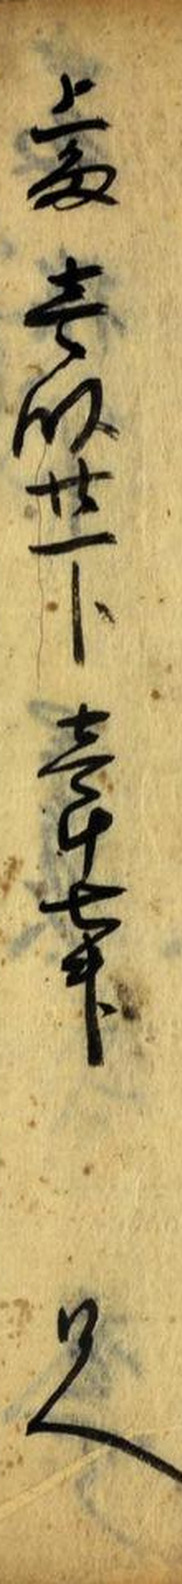上畠壱畝廿一文壱斗七升同人
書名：越前国西方内志津庄内本折村御検地帳
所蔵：福井県文書館 Fukui Prefectural Archives
